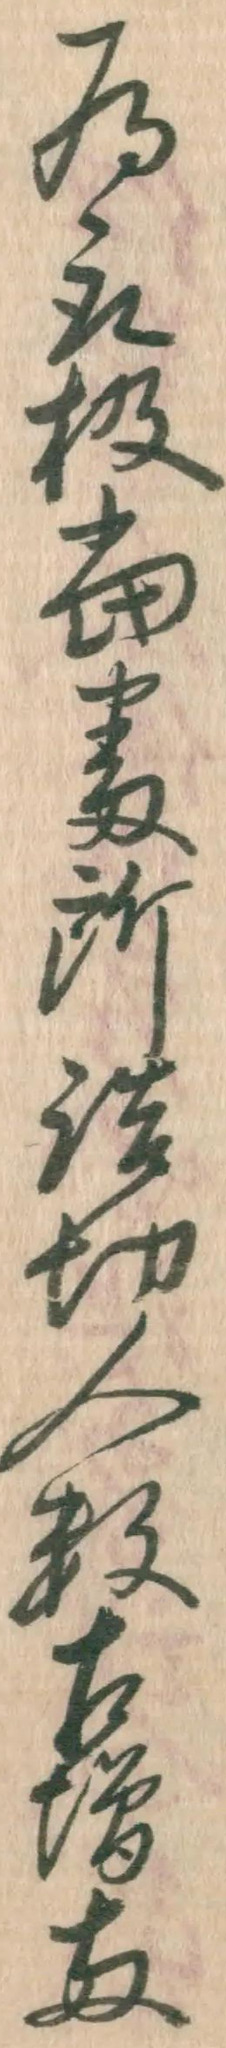為取扱当番所詰切人数相増両
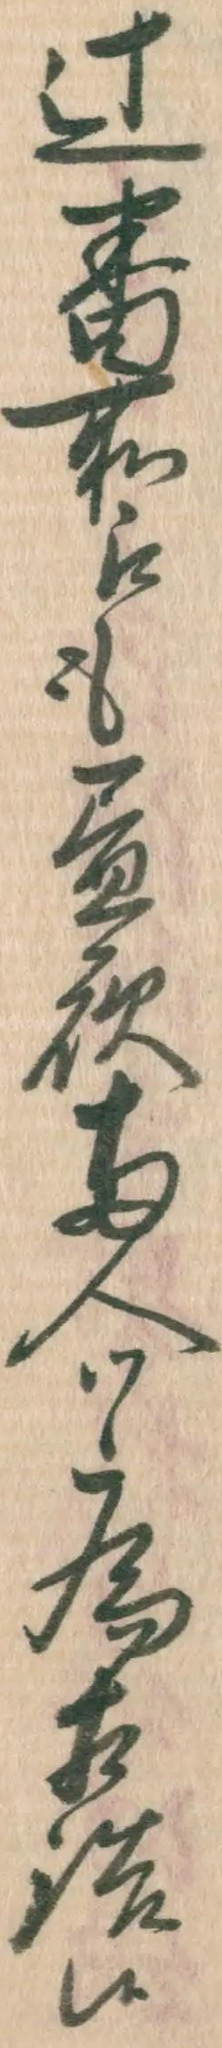辻番所えも昼夜両人ツヽ為相詰候
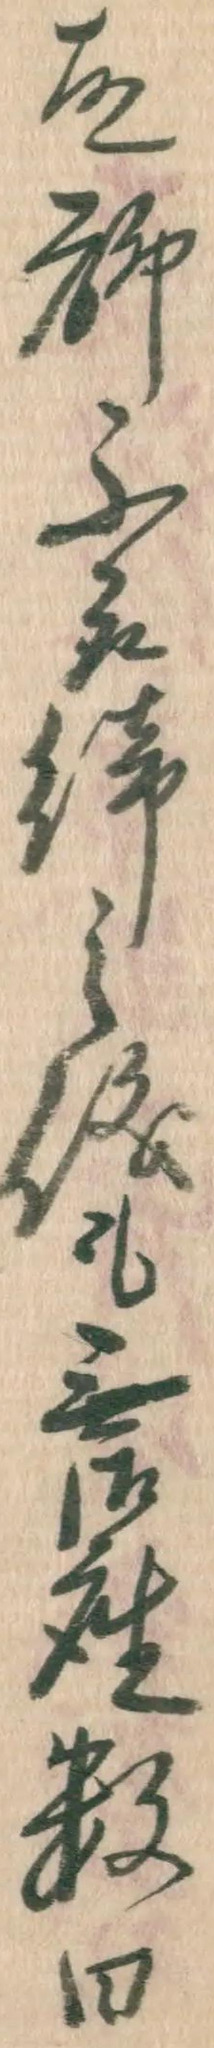故聊不取締之儀も無御座数日
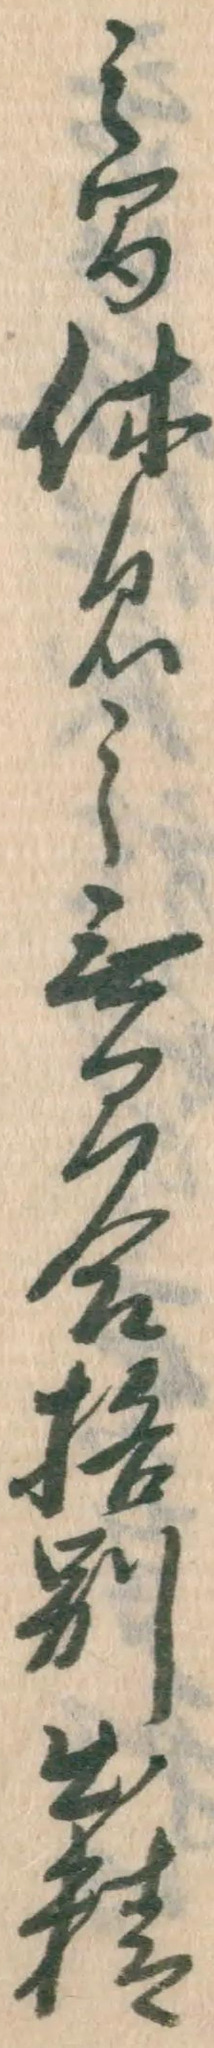之間休息之無間合格別出精
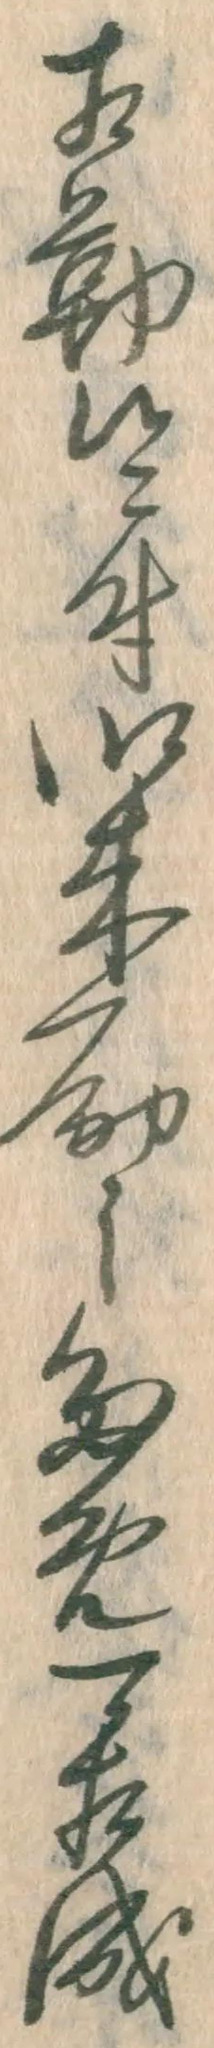相勤候ニ付以来励之ため可相成

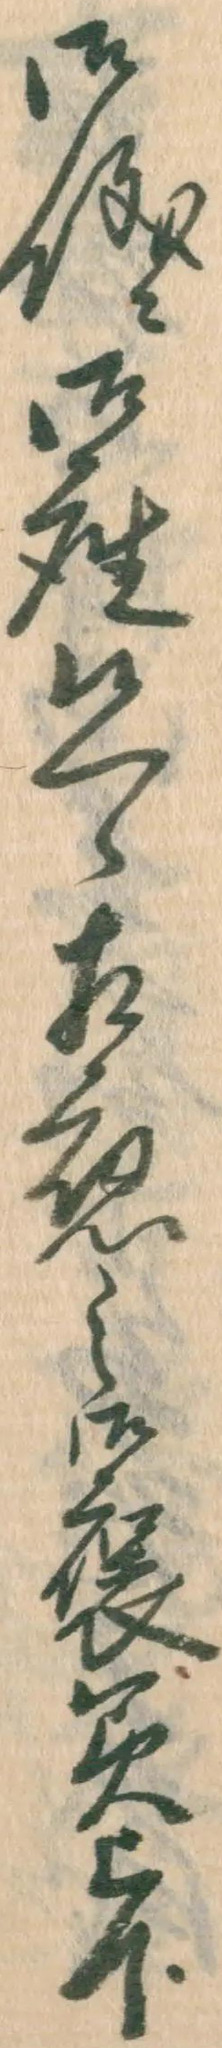候儀ニ御座候ハヽ相応之御褒美被下
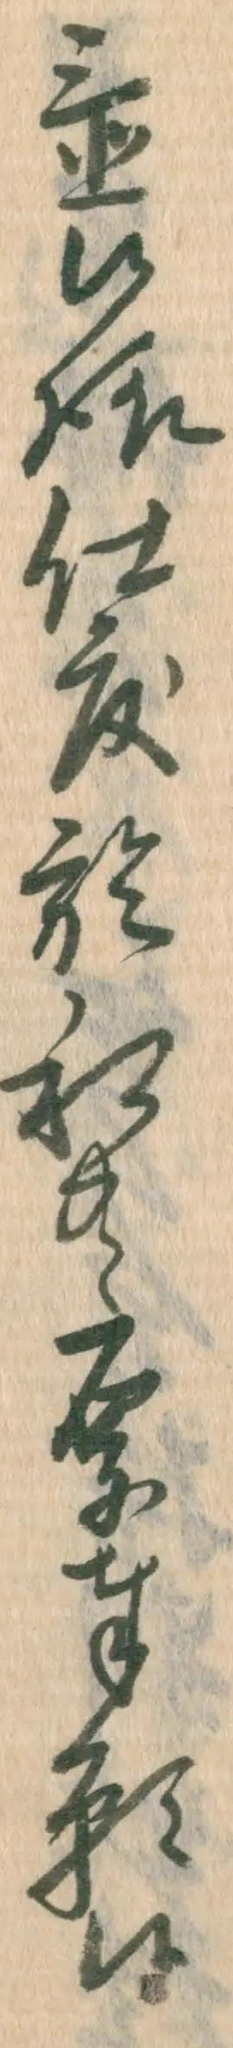置候様仕度於私共厚奉願候
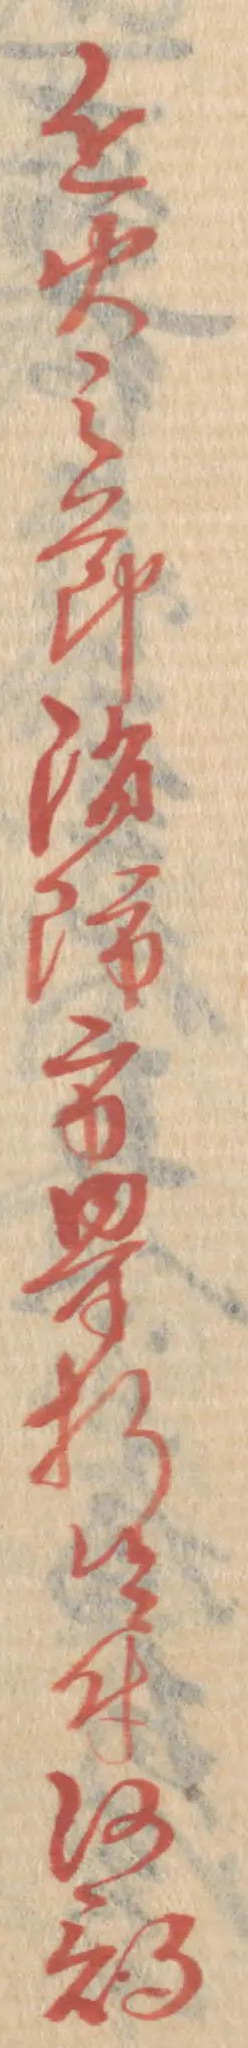近火之節消防方骨折候ニ付阿部
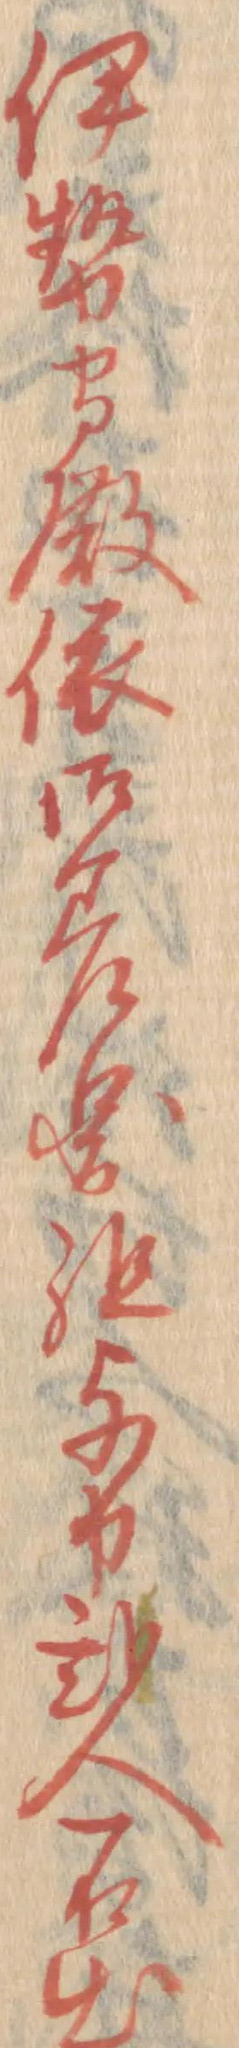伊勢守殿依御指図組与力弐人石出
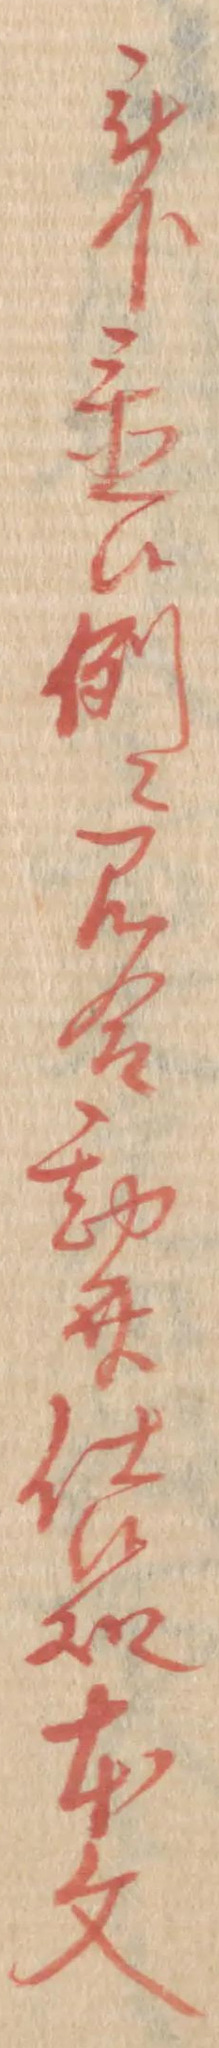被下置候例ニ見合勘弁仕候処本文
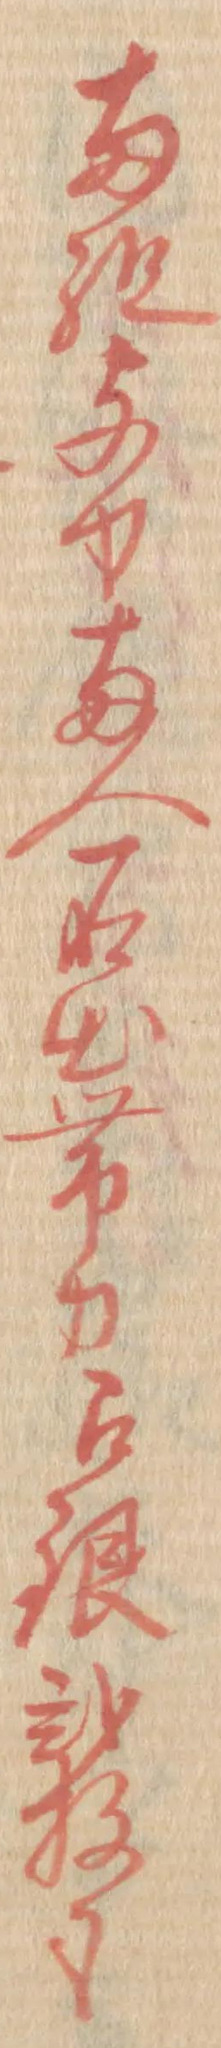両組与力両人石出帯刀え銀弐枚ツヽ
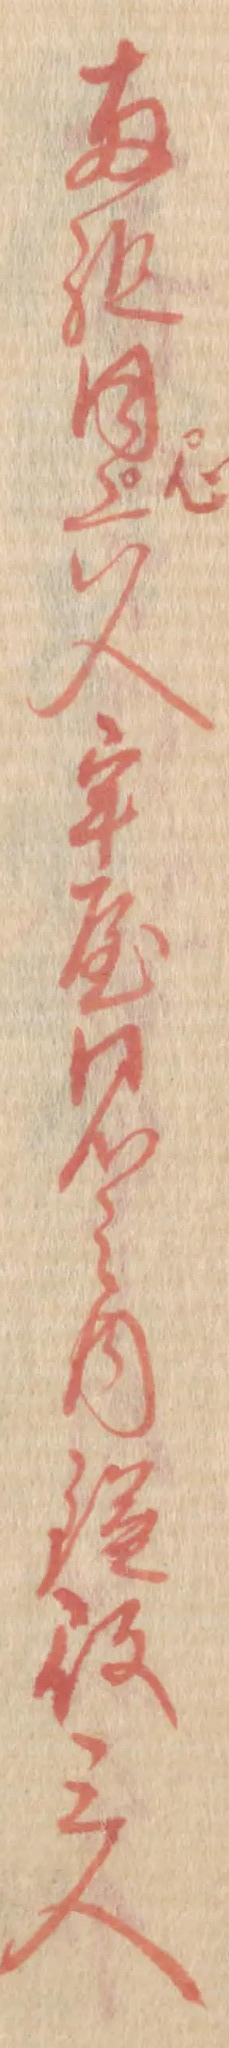両組同心六人牢屋同心之内鎰役三人

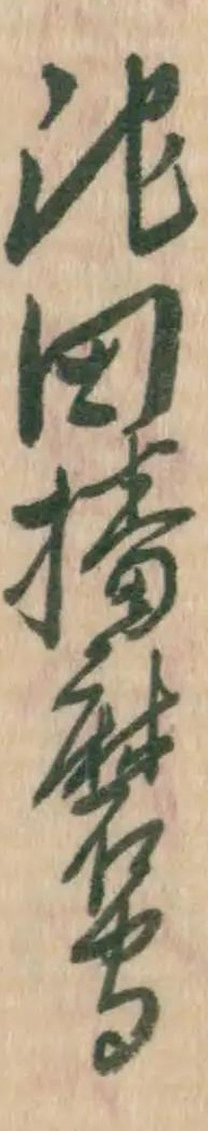池田播磨守
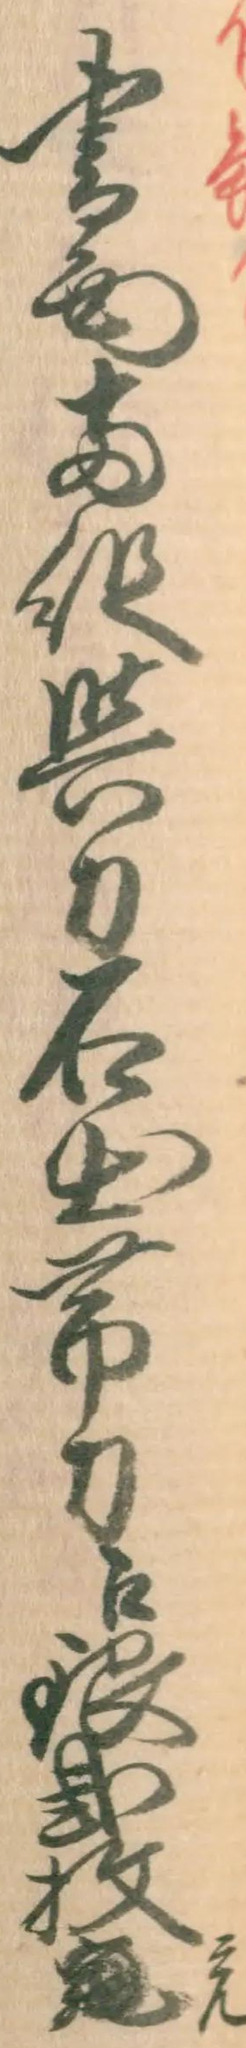書面両役与力石出帯刀え銀弐枚宛
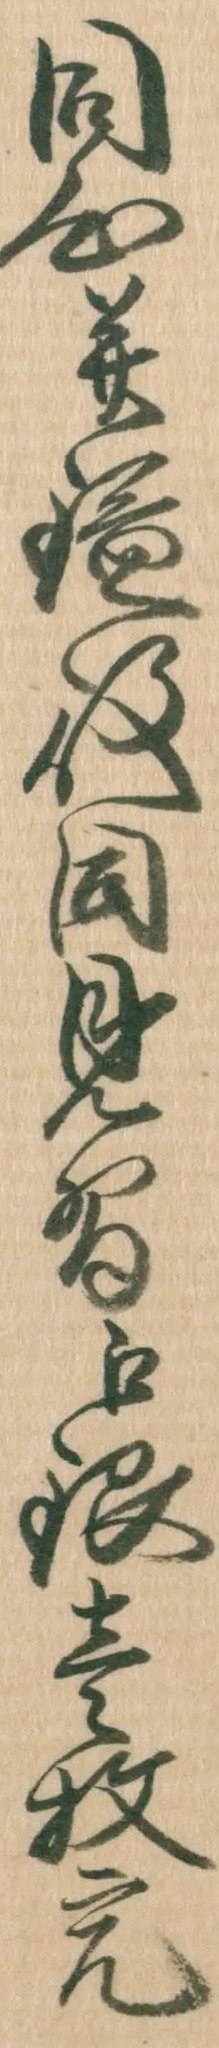同心幷鎰役同見習え銀壱枚宛
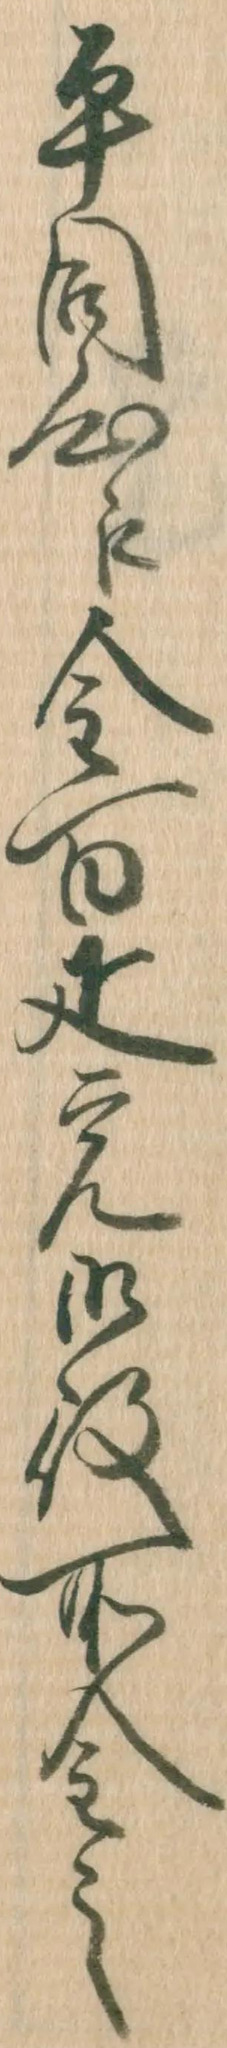平同心え金百疋宛御役所金之
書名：七十冊物類集 71巻. [44] 四十三 牢屋敷御普請御修覆地震ニ付骨折候牢屋掛御褒美之部
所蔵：国立国会図書館 National Diet Library, JAPAN
